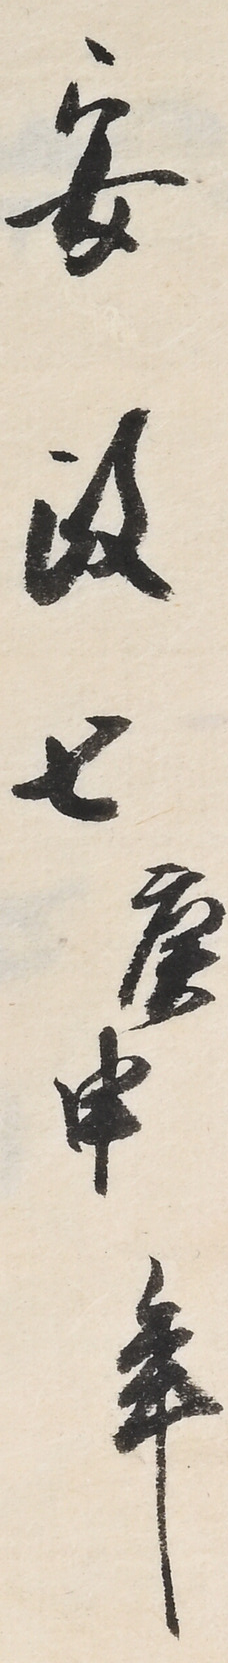安政七庚申年
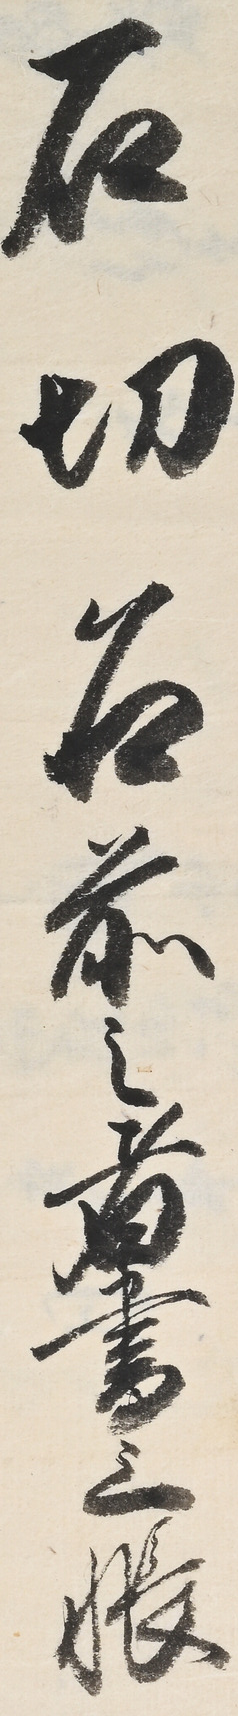石切名前之者書上帳

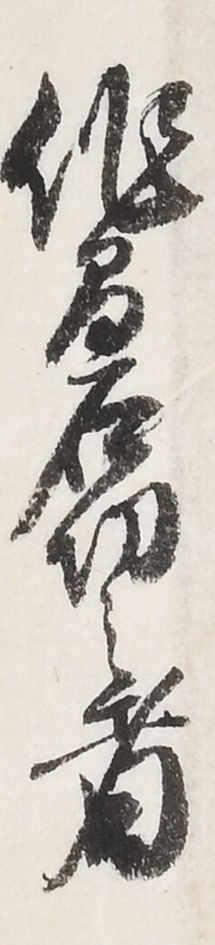作間石切之者
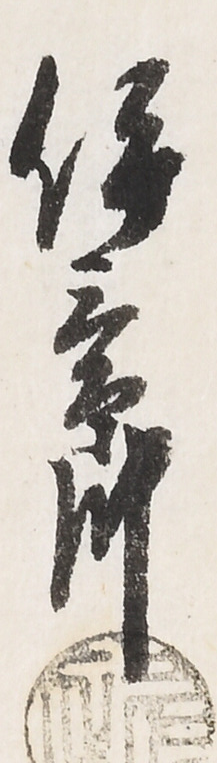伊三郎㊞
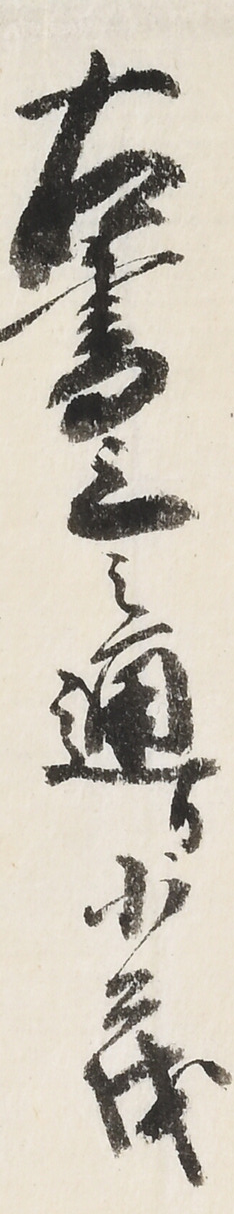右書上之通り少茂
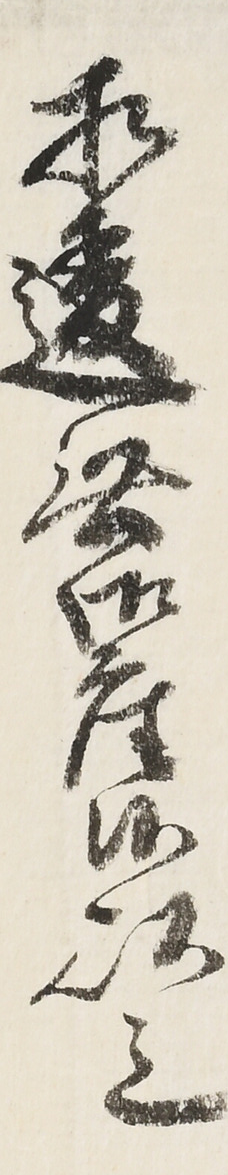相違無御座候以上
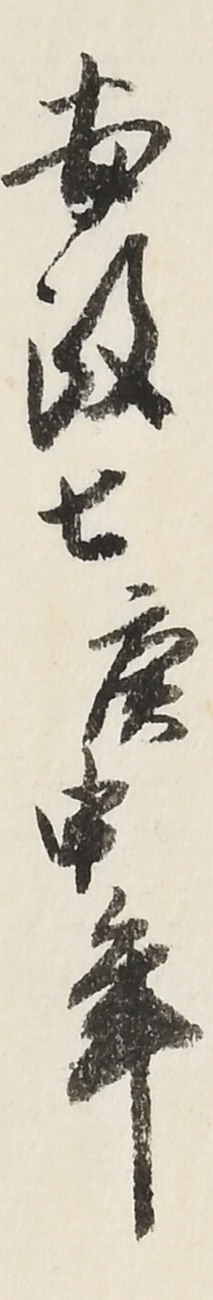安政七庚申年

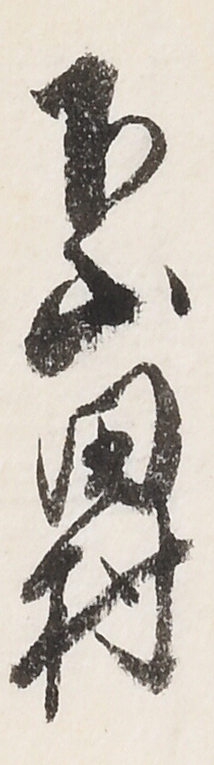下山田村
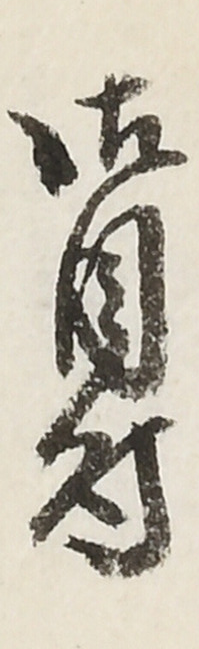御目付
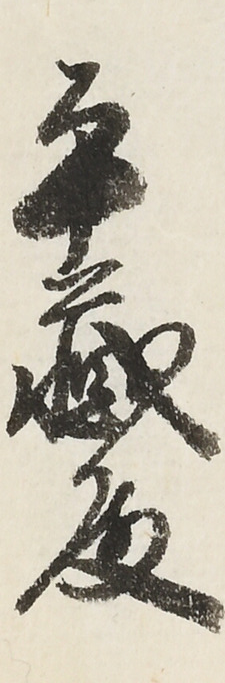平蔵殿
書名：安政七庚申年二月石切名前之者書上帳
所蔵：伊那市立高遠町図書館・合同会社AMANE
